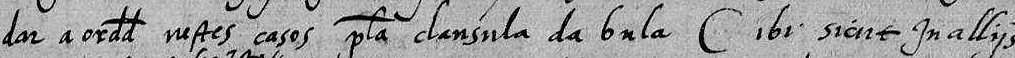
dar a ord̄d nestes casos p̄la clausula da bula C ibi sicut Jn allijs
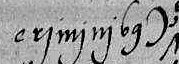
crjmjnjbꝯ
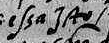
cessa Jsto
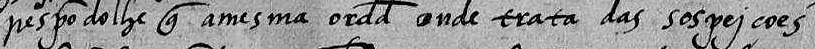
respōdo lhe q̄ a mesma ord̄d onde trata das sospejções
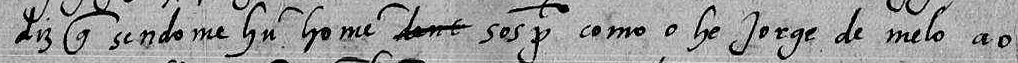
diz q̄ sendo me hū homē dent sospto como o he Jorge de melo ao
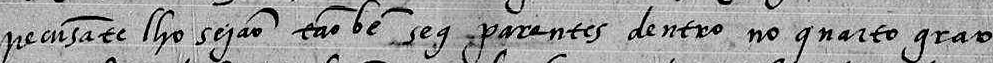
recusāte lho sejão tãobē seꝯ parentes dentro no quarto grao
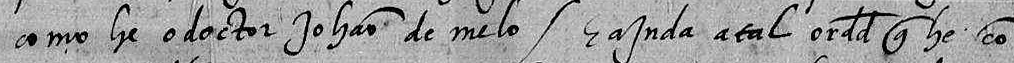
como he o doctor Johão de melo / E aJnda a tal ord̄d q̄ he c̄o
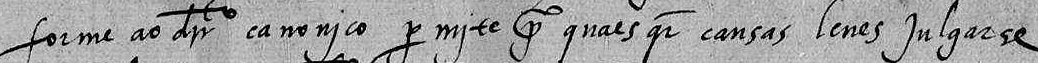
forme ao drto canonjco ꝑmjte p̄o quaesq̄r causas leues Julgarse
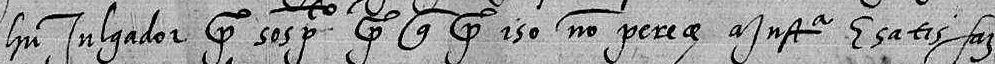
hū Julgador p̄o sospto p̄oq̄ p̄o iso n̄o perece a Justa E satisfaz
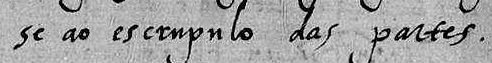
se ao escrupulo das partes.
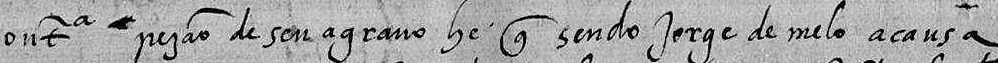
outra rezão de seu agrauo he q̄ sendo Jorge de melo a causa
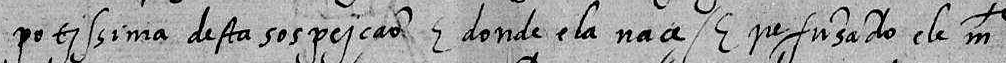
potjssima desta sospejção E donde ela nace / E refusādo ele mte
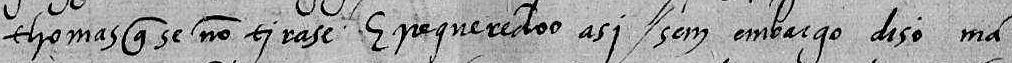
thomas q̄ se n̄o tjrase E requerēdoo asj / sem embargo diso mā
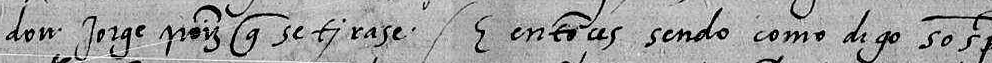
dou. Jorge rōiz q̄ se tjrase / E entōces sendo como digo sospto
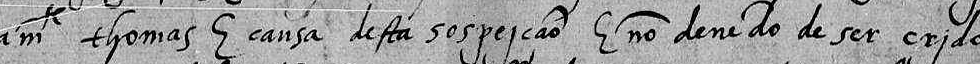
a mte thomas E causa desta sospejção E n̄o deuēdo de ser crjdo
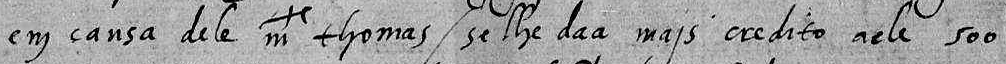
em causa dele mte thomas / se lhe daa majs credito a ele soo
